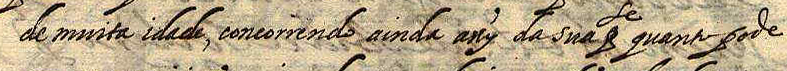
de muita idade, concorrendo ainda assy da sua pte quanto pode
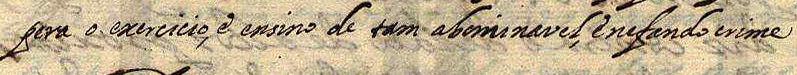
pera o exercicio, e ensino de tam abominavel, e nefando crime
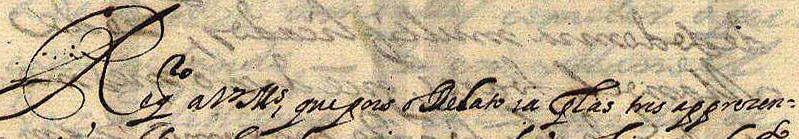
Reqro a Vs Ms, que pois o Delato ia plas tres apprezen
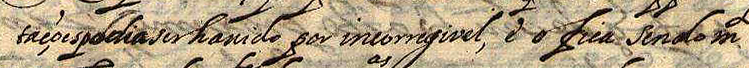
tações podia ser hauido por incorregivel, e o fica sendo mto
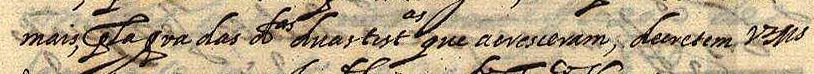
mais, p̄la ꝓva das d̄as duas testas que acresceram, decretem Vs Ms
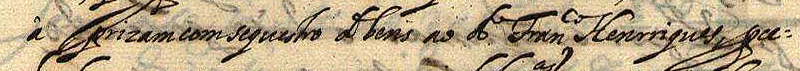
a prizam com sequestro d̄ bens ao d̄o Franco Henrriques, ꝓce
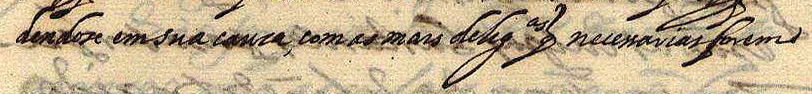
dendose em sua cauza, com as mais deligas q̄ necessarias forem
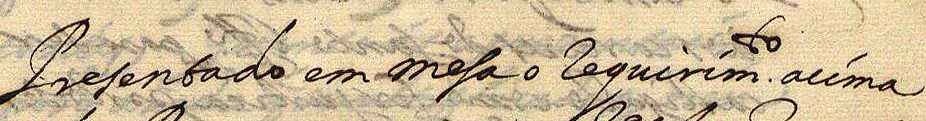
Presentado em mesa o Requirim.to acima
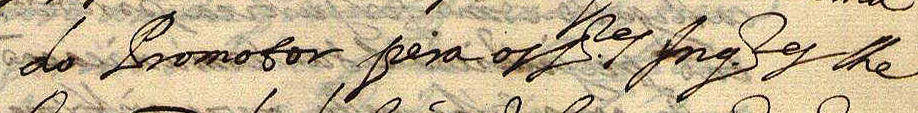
do Promotor pera os s.res Jnqres lhe
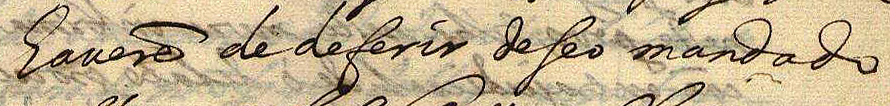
hauerē de deferir de seo mandado
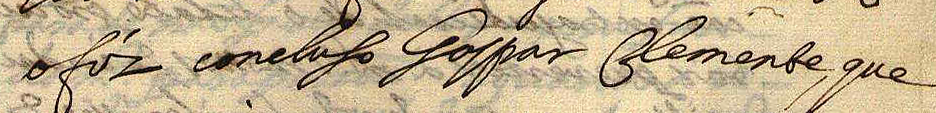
o fiz concluso Gaspar Clemente, que
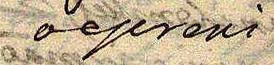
o escreui
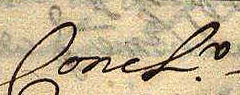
ConcLo
